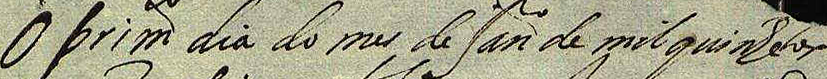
O Primro dia do mes de Janro de mil quinhetos
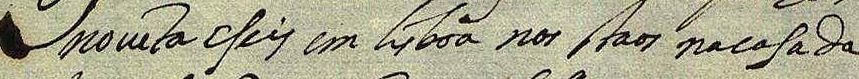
nouēta E seis em Lisboa nos staos na casa da
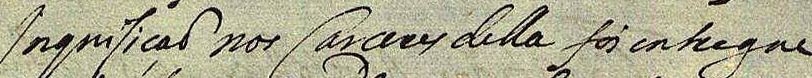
Jnquisiçaõ nos Carceres della foi entregue
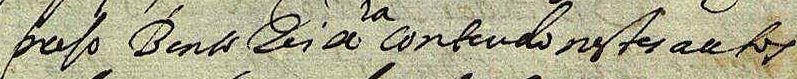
preso Bento Teixra conteudo nestes autos
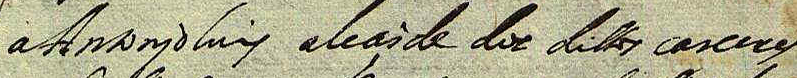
a Antonjo luis alcaide dos dittos carceres
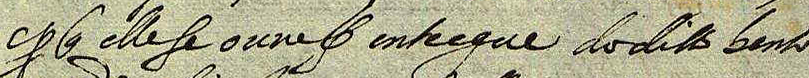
e ꝓq̄ elle se ouue p̄ entregue do ditto bento
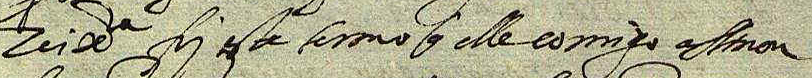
Teixra fiz este termo q̄ elle comigo assinou
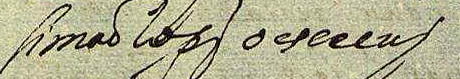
Simaõ Lopz̄ o escreuj
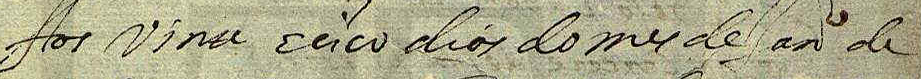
Aos vinte E cic̄o dias do mes e Janro de
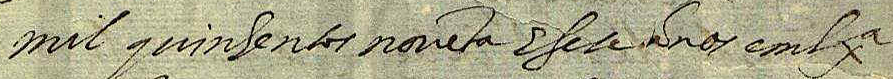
mil quinhentos nouēta E sete an̄os em Lxa
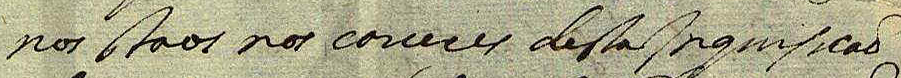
nos staos nos carçeres desta Jnquisicaõ
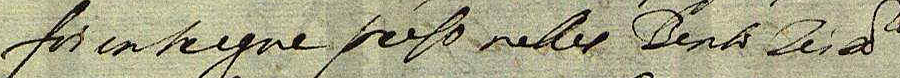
foi entregue preso nelles Bento Teixra
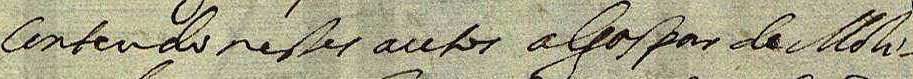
conteudo nestes autos a Gaspar de Moli
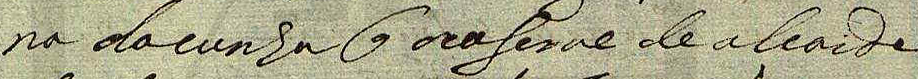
na da cunha q̄ ora serue de alcaide
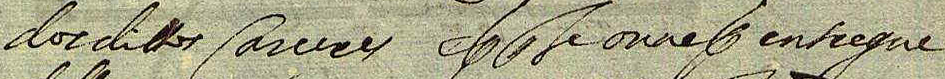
dos dittos Carçeres e p̄q̄ se ouue p̄ entegue
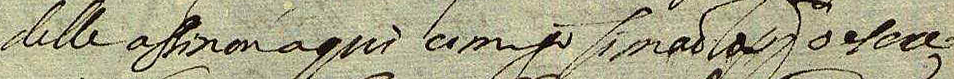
delle assinou aqui comigo Simaõ Lopz̄ o escre
